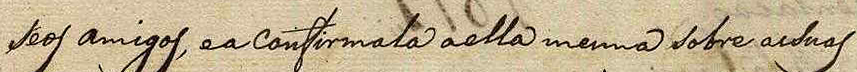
seos amigos, e a confirmala a ella mesma sobre as suas
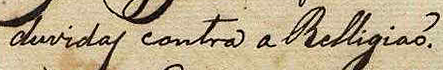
duvidas contra a Relligiaõ.
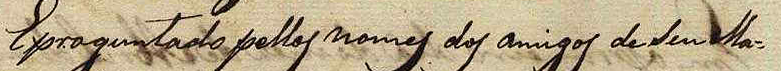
E proguntado pellos nomes dos amigos de seu Ma
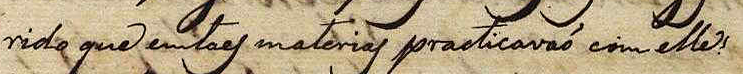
rido que em taes materias practicavaõ com elle?
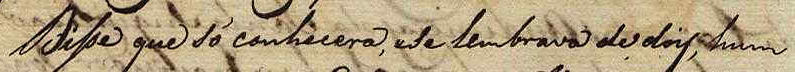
Disse que só conhecera, e se lembrava de dois, hum
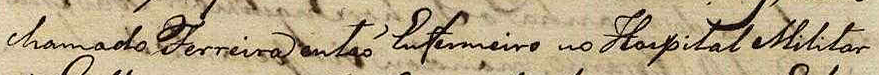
chamado Ferreira entaõ Enfermeiro no Hospital Militar
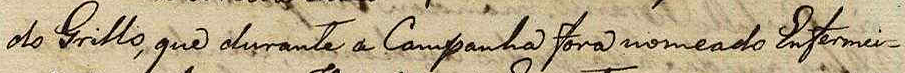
do Grillo, que durante a Campanha fora nomeado Enfermei
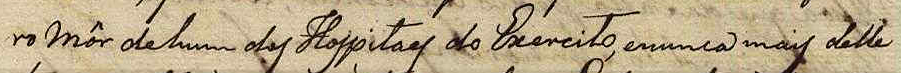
ro môr de hum dos Hospitaes do Exercito, e nunca mais delle
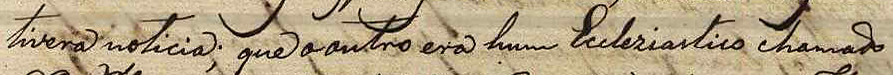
tivera noticia; que o outro era hum Eccleziastico chamado
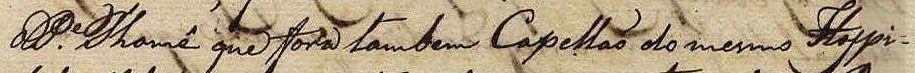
P.e Thomé que fora tambem Capellaõ do mesmo Hospi
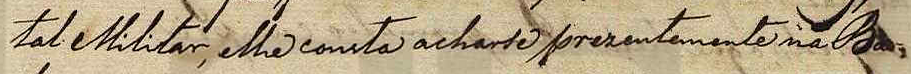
tal Militar, e lhe consta acharse prezentemente na Ba
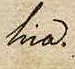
hia.
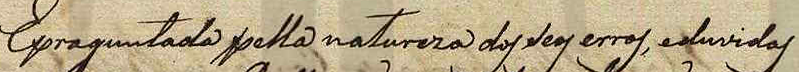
E proguntada pella natureza dos seos erros, e duvidas
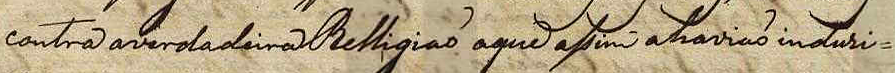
contra a verdadeira Relligiaõ a que assim a haviaõ induzi
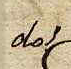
do?
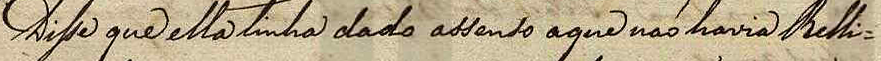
Disse que ella tinha dado assento a que naõ havia Relli
